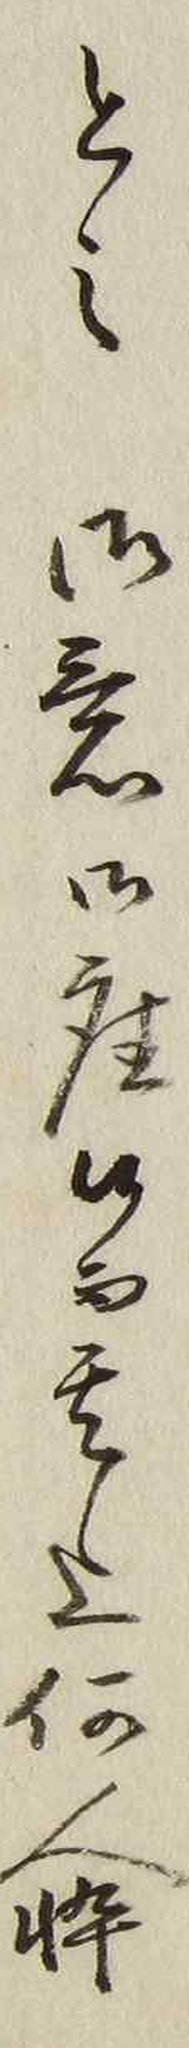と之御意御座候而其上何人忰
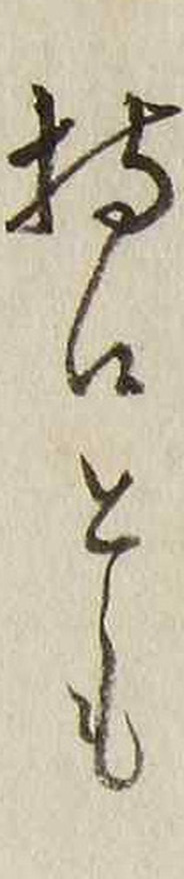持候とも

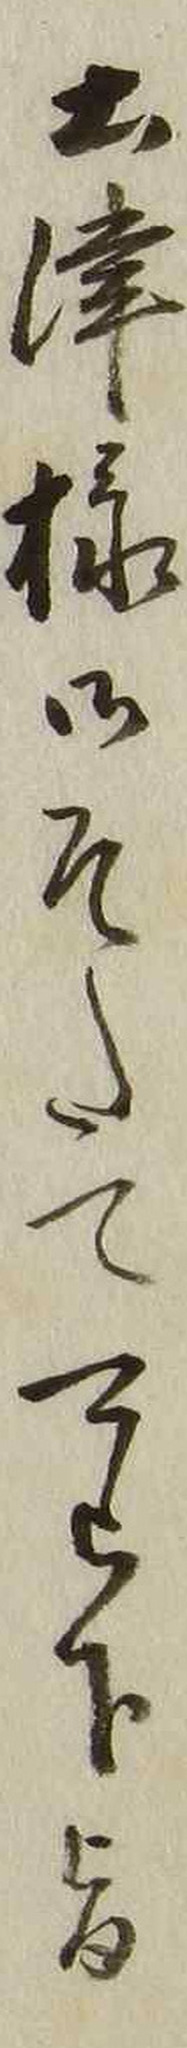土津様御そたて可被下旨
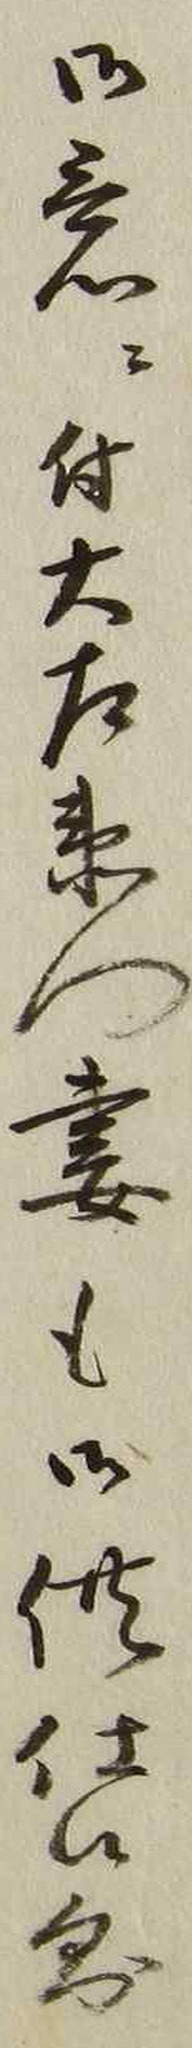御意ニ付大左衛門妻も御供仕候則
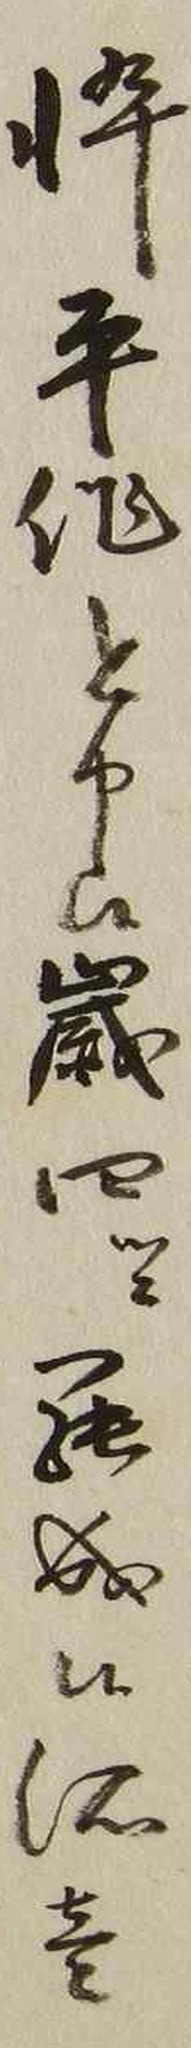忰平作と申候歳四ツニ罷成候所壱
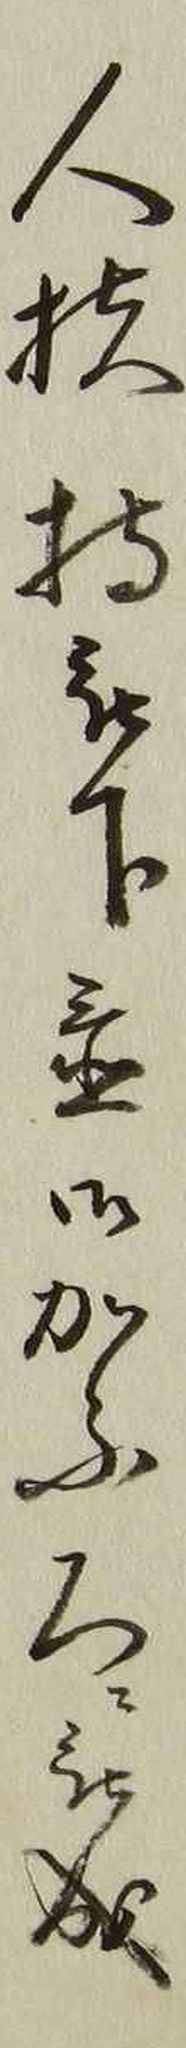人扶持被下置御かふろニ被成
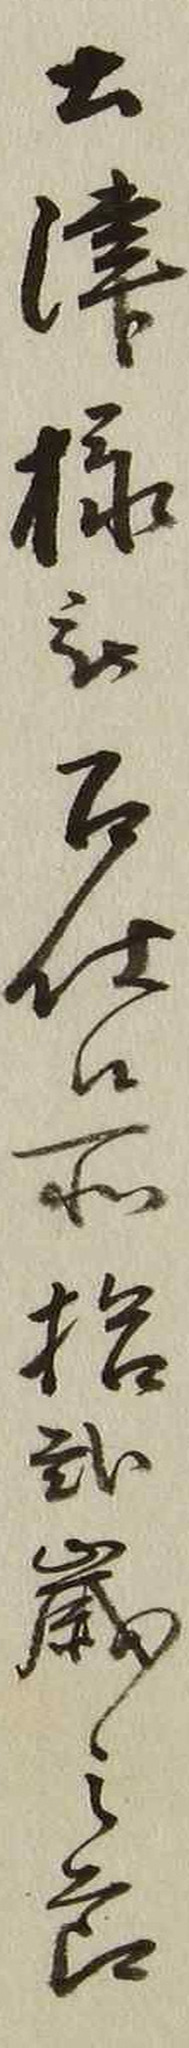土津様被召仕候所拾弐歳之節
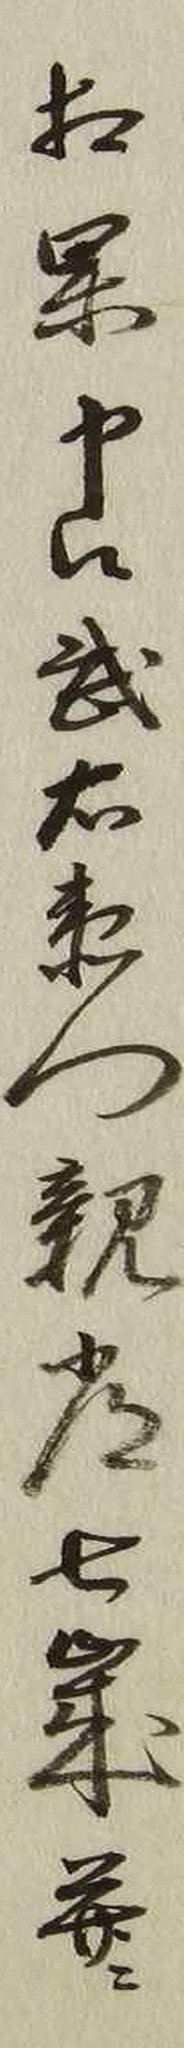相果申候武右衛門親常七歳并ニ
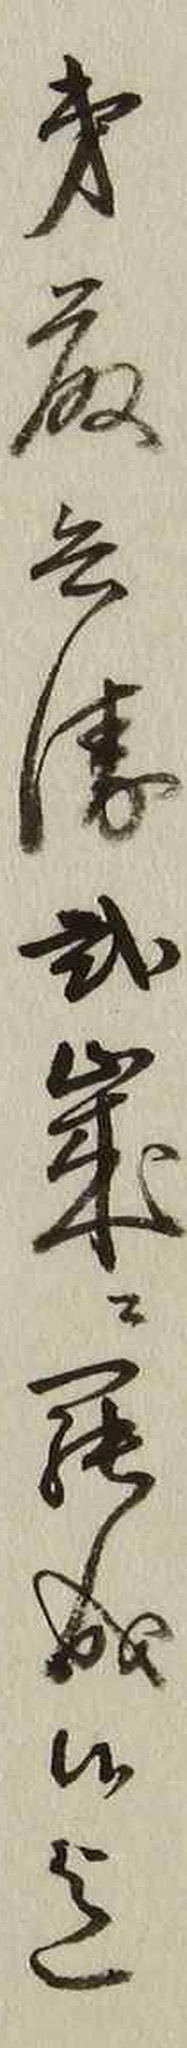弟藤兵衛弐歳ニ罷成候迄
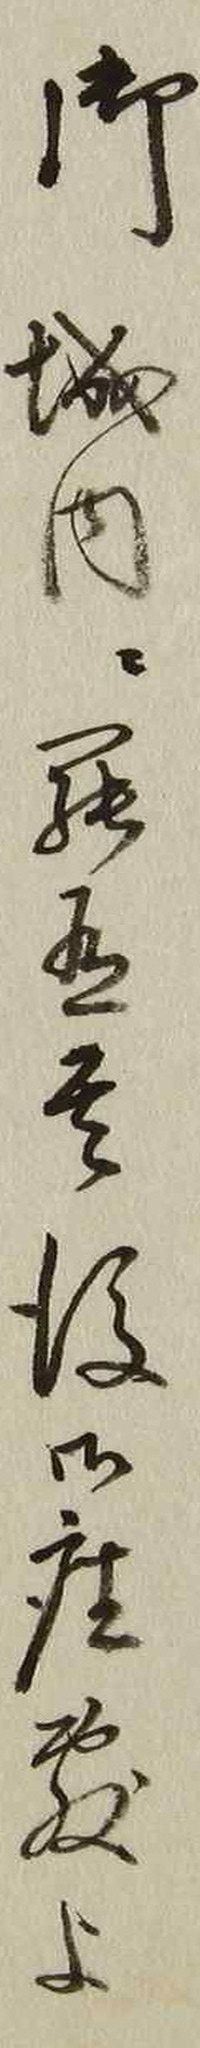御城内ニ罷有其後御座敷よ
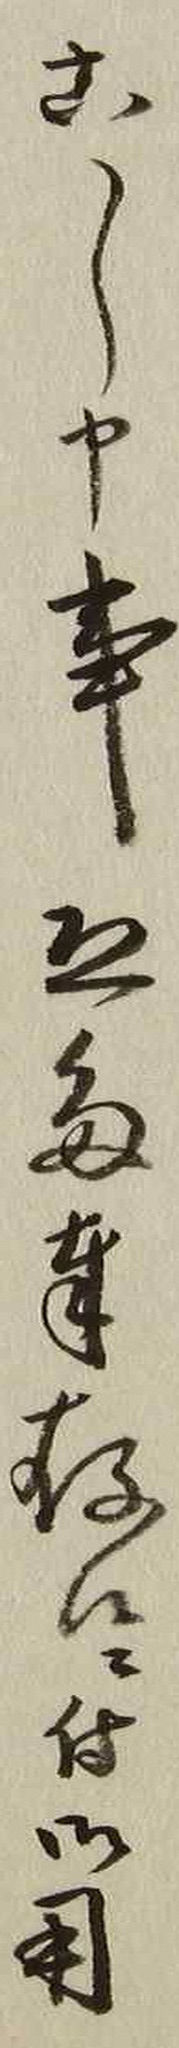こし申事恐多奉存候ニ付御用
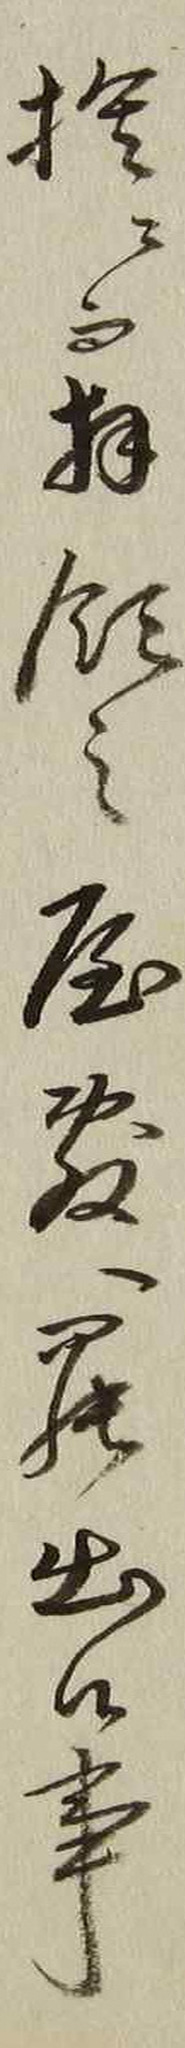捨ニ而拝領之屋敷へ罷出候事
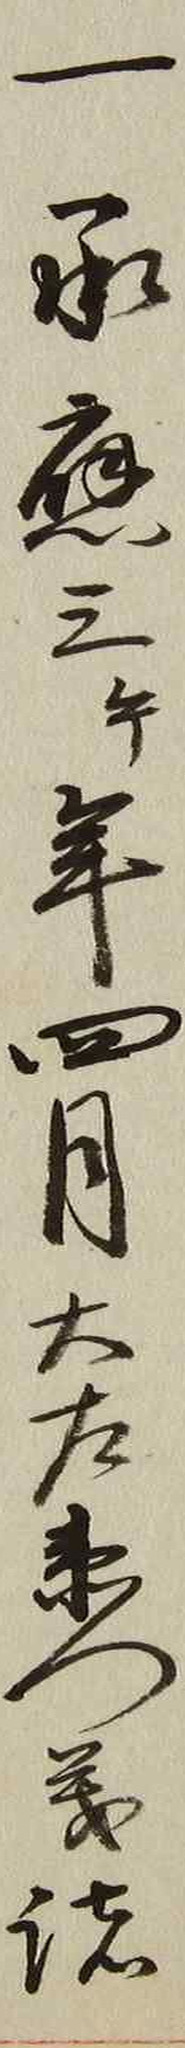一承応三午年四月大左衛門義諸
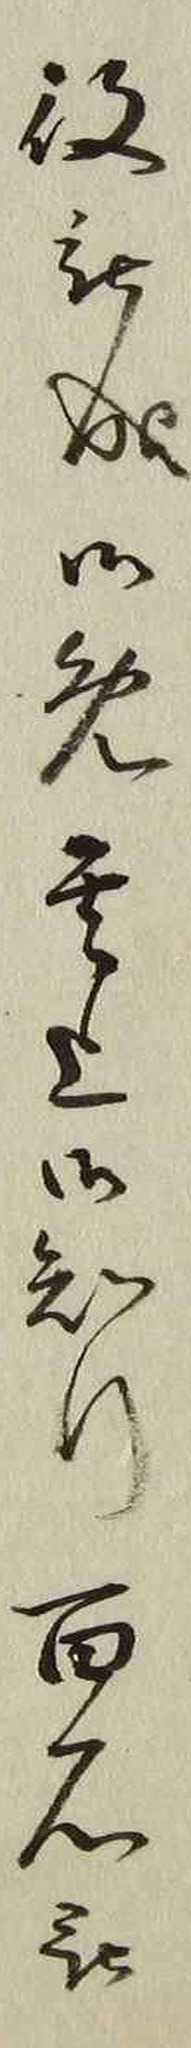役被成御免其上御知行百石被
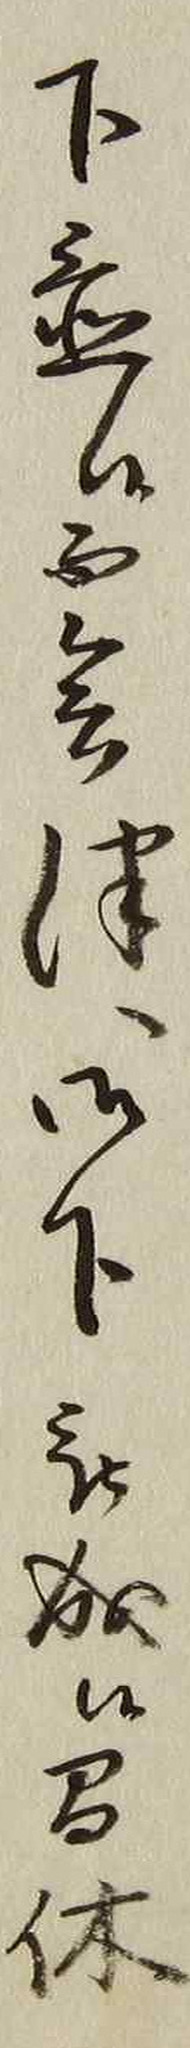下置候而会津へ御下被成候間休
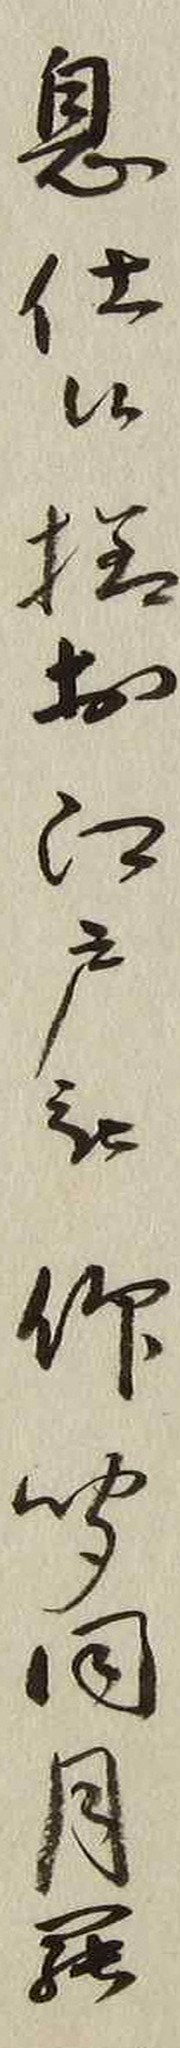息仕候様於江戸被仰聞同月罷
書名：諸士系譜　巻之149　そ之部2
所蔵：会津若松市立会津図書館
